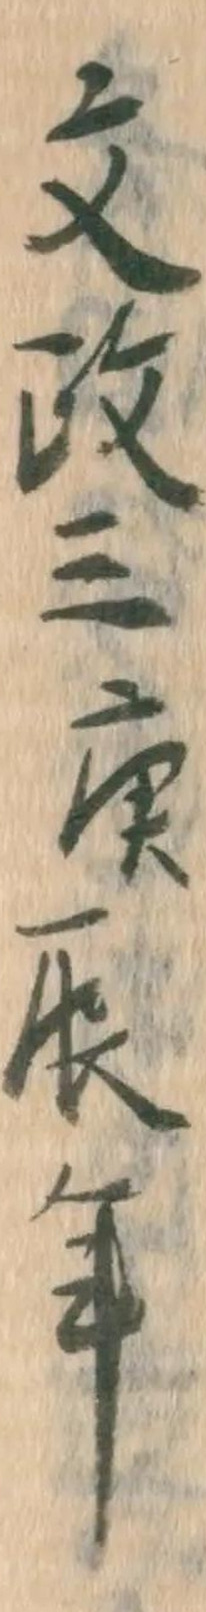文政三庚辰年
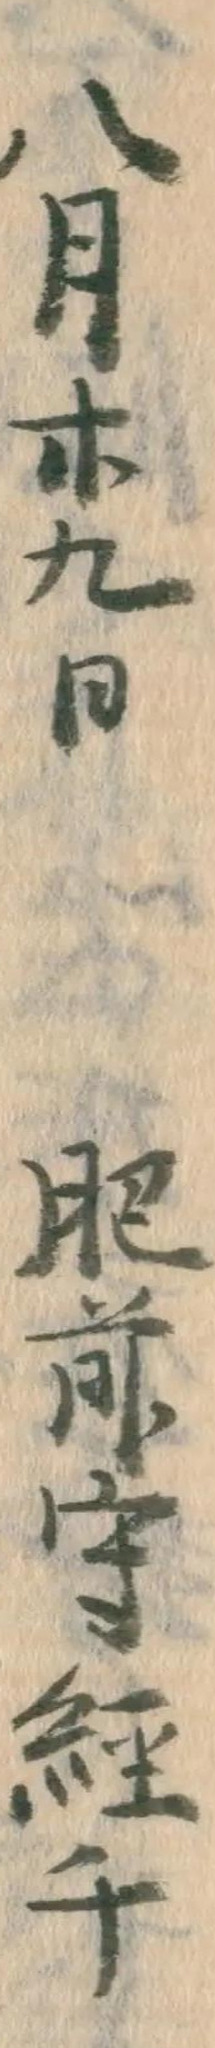八月廿九日肥前守経千
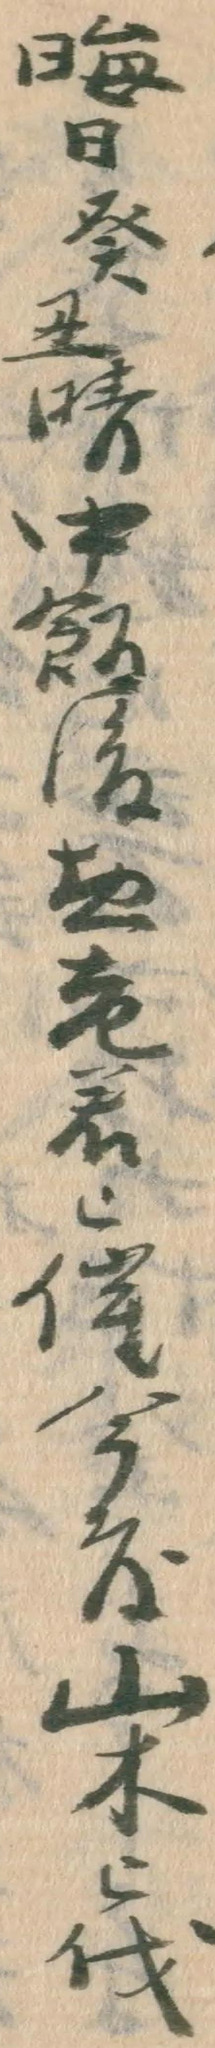晦日癸丑晴、中飯後惣老若被催、今度山木被伐
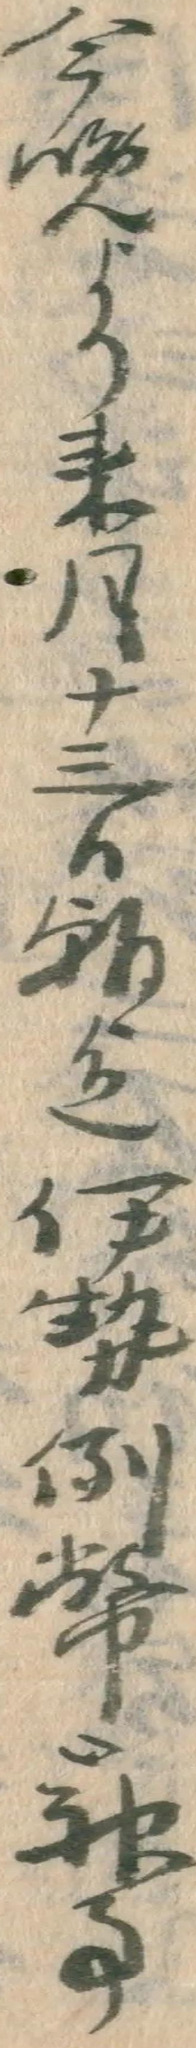今晩より来月十三日朝迄、伊勢例幣御神事
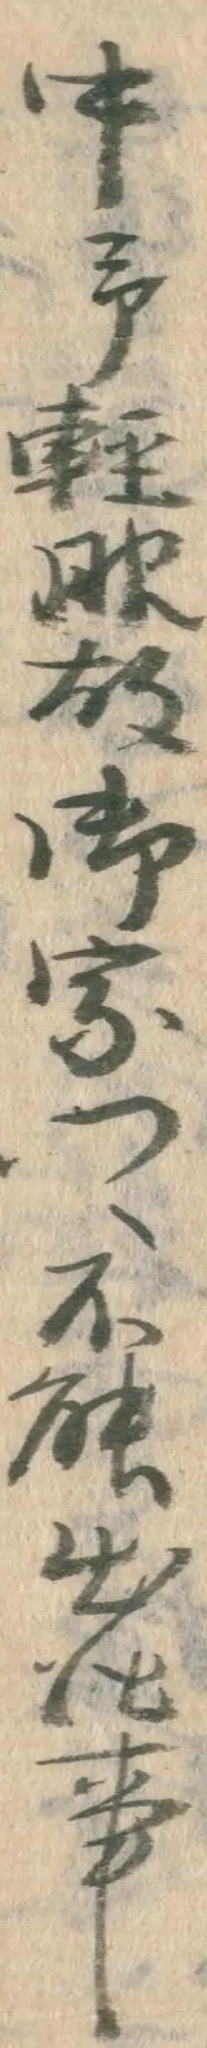中、予軽服故御家門へ不能出仕事、
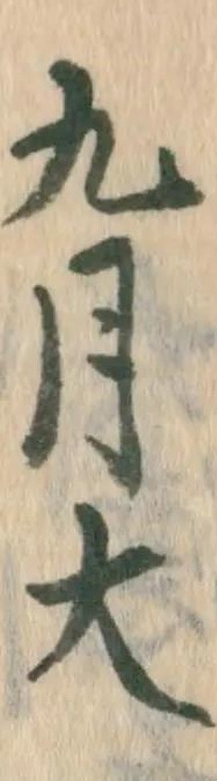九月大
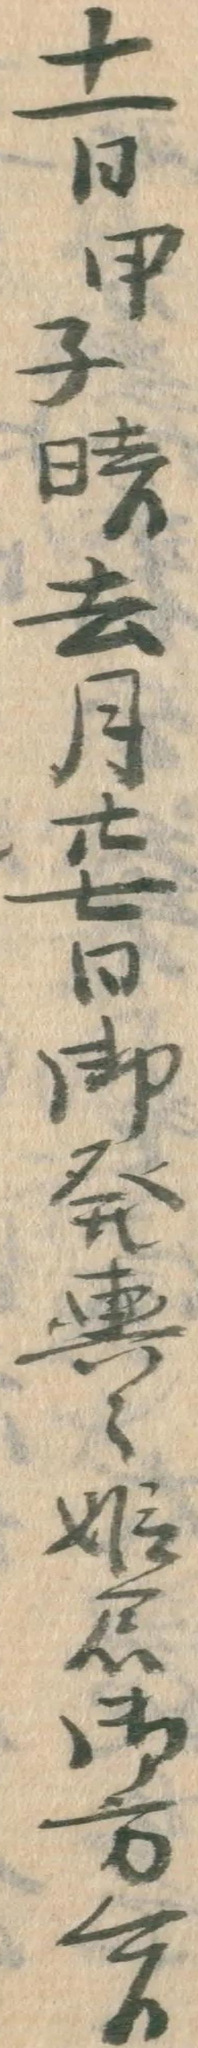十一日甲子晴、去月廿七日御発輿之姫君御方、今日
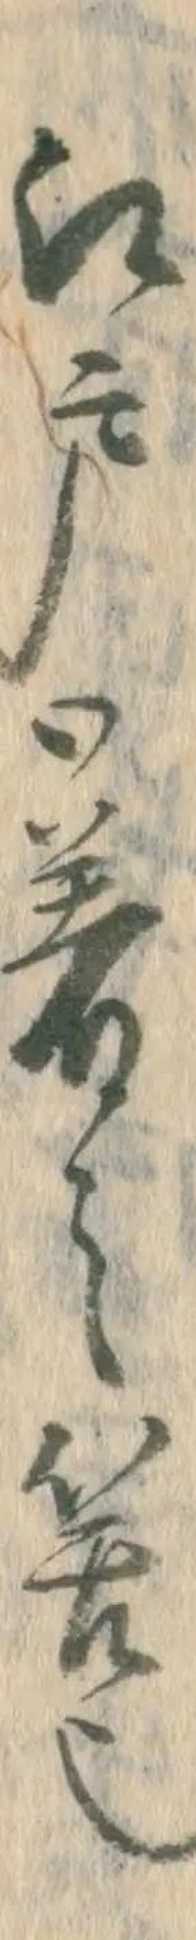江戸御着之筈也、
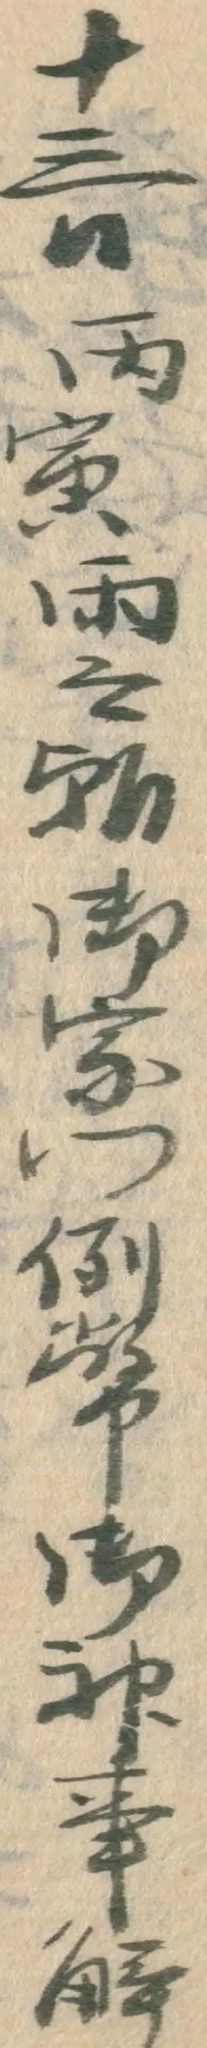十三日丙寅雨、今朝御家門例幣御神事解
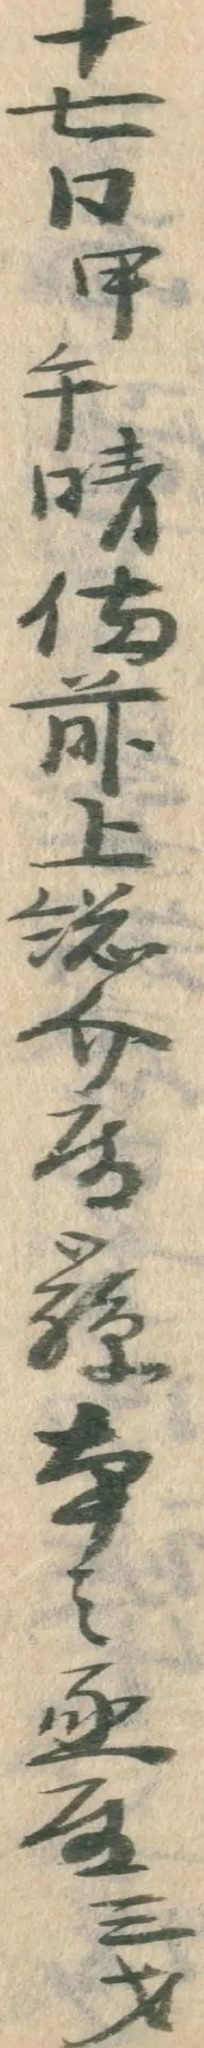十七日甲午晴、備前上総介殿御孫本之丞殿三才
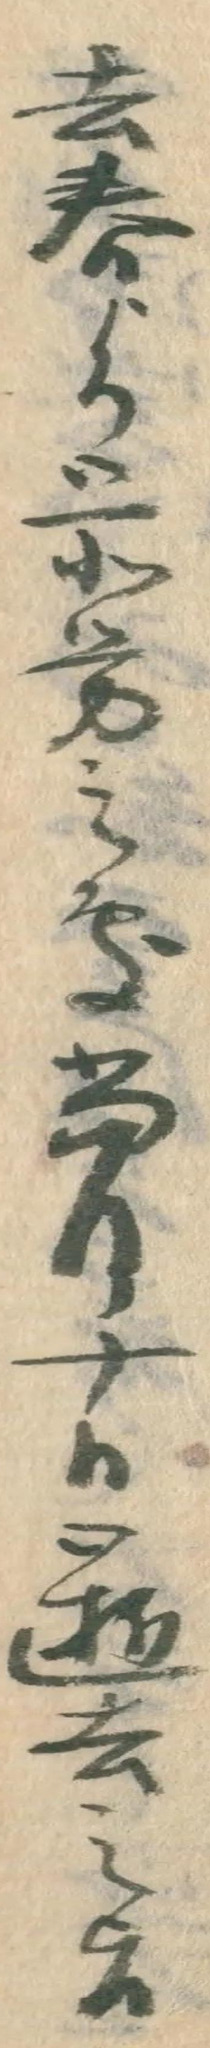去春より御所労之處、當月十日御逝去之旨

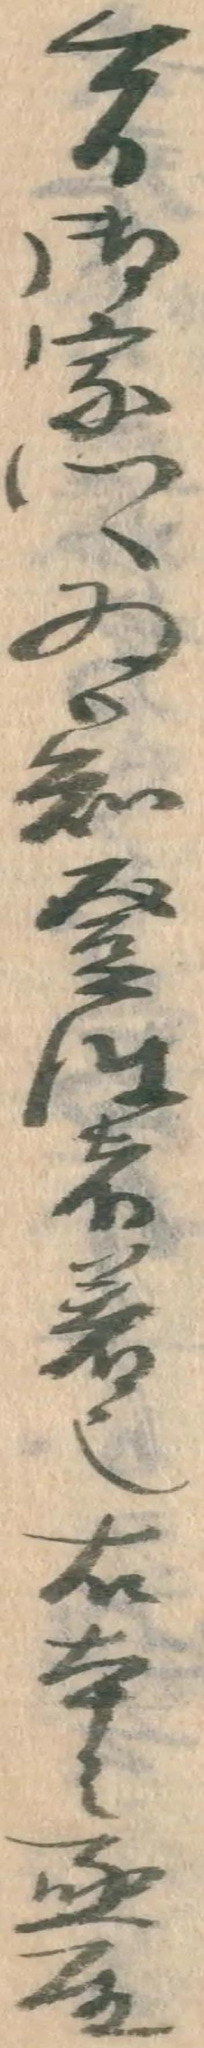今日御家門へ為御知登城者着也、右本之丞殿
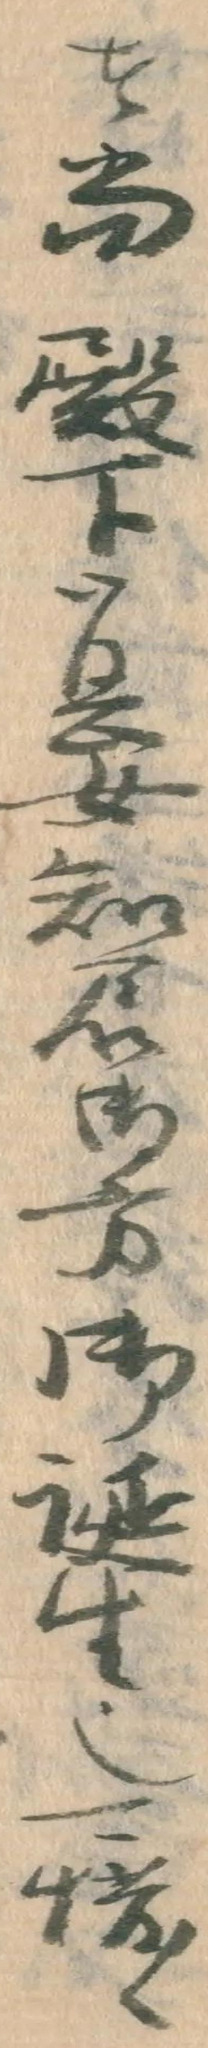者當殿下御息女知君御方御誕生也、可惜候
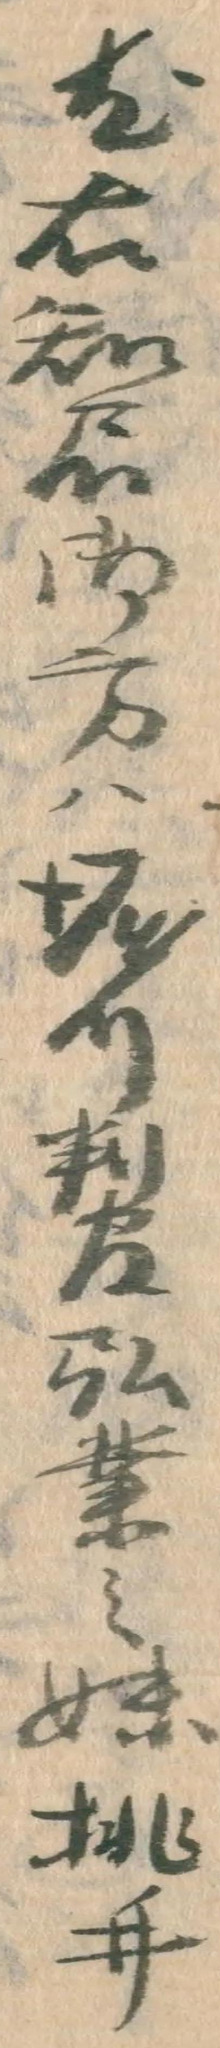尤右知君御方ハ堀川判官弘業之妹桃井
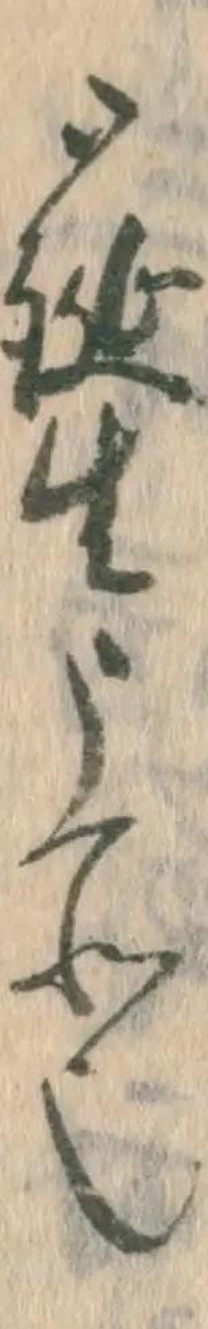御誕生申所也、
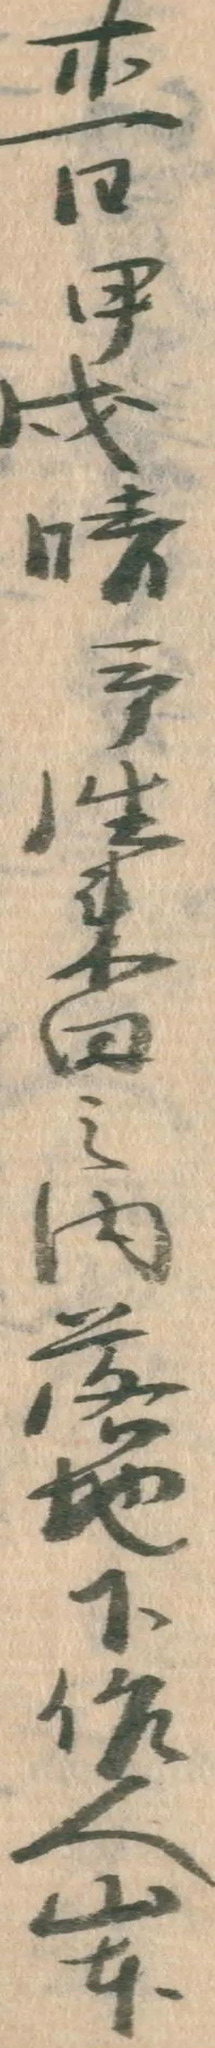廿一日甲戌晴、予往来田之内落地下作人山本
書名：賀茂社記録. 第63冊
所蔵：国立国会図書館 National Diet Library, JAPAN
